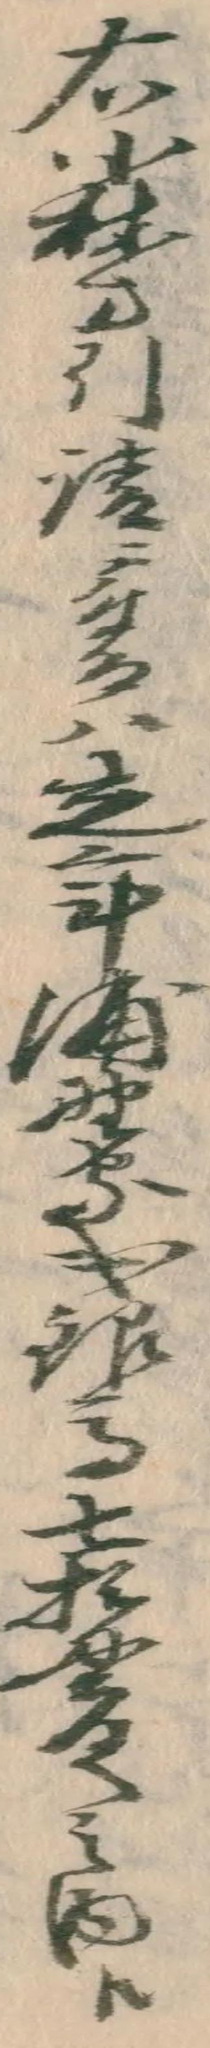右小林方引請ニ付而ハ先年浦野家出銀高七拾貫匁之内え
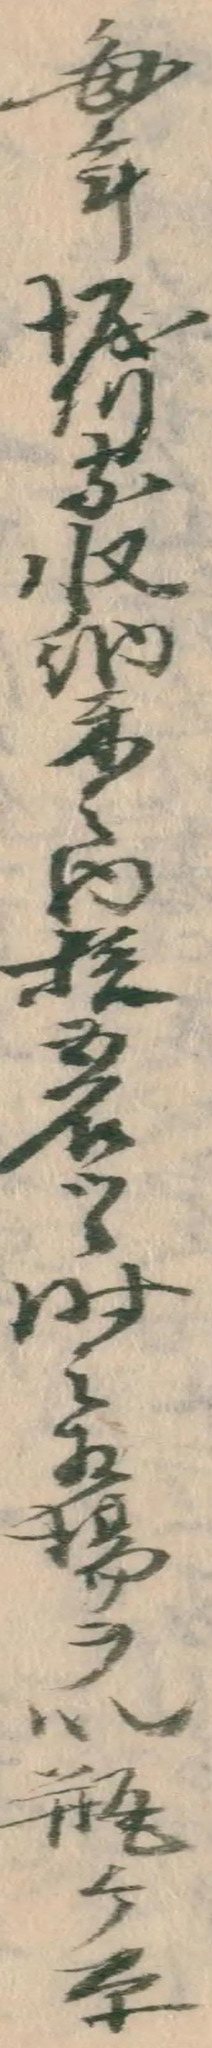毎年堀川家収納米之内拾五石ツヽ時之相揚ヲ以瓶ケ原
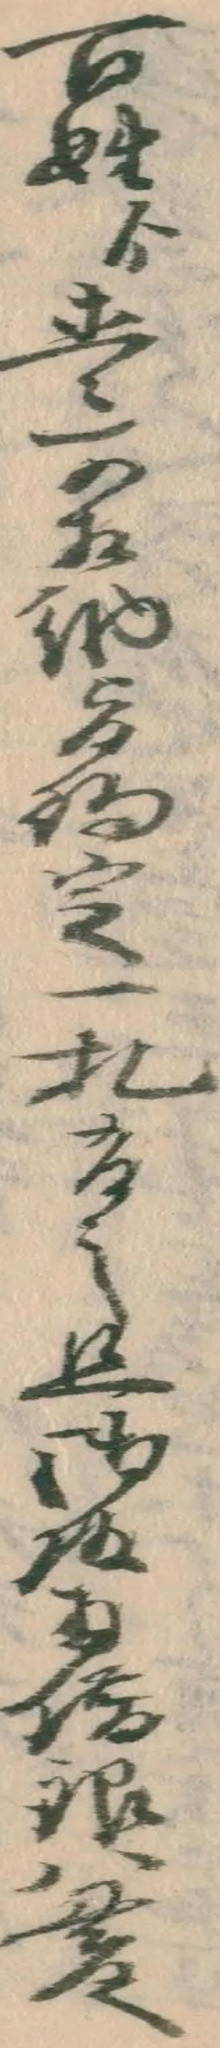百姓ゟ直々可相納旨約定一札有之且御殿拝借銀八貫
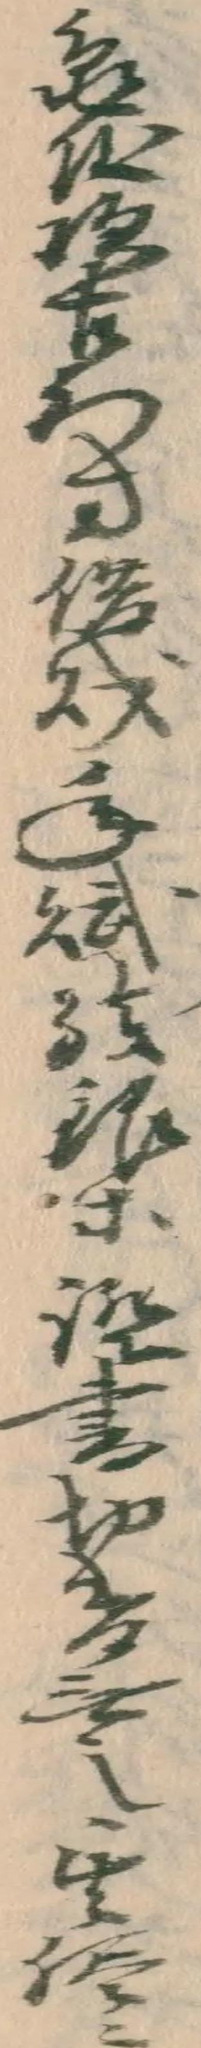亀屋次左衛門方借財年賦残銀等證書切替無之其侭ニ
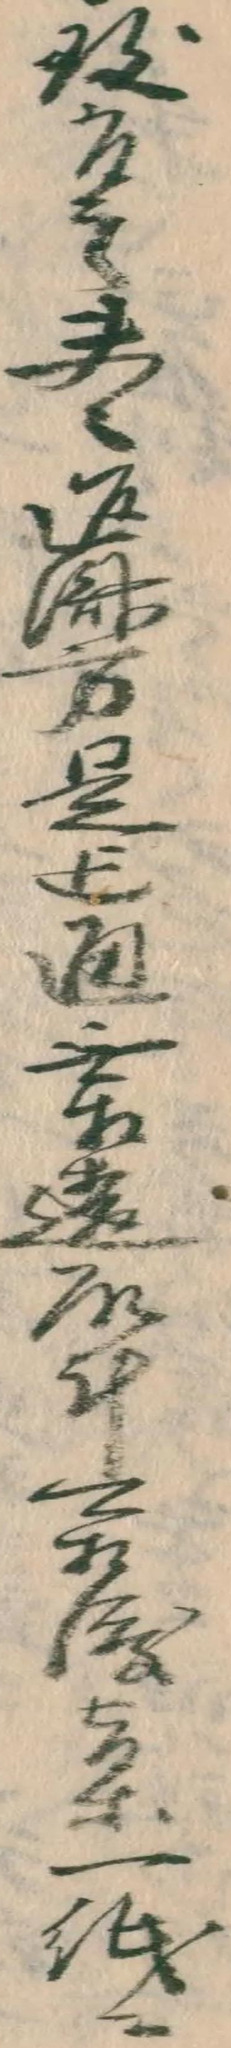致有之夫々追済方是迄通無相違取斗可相渡旨等一紙ニ
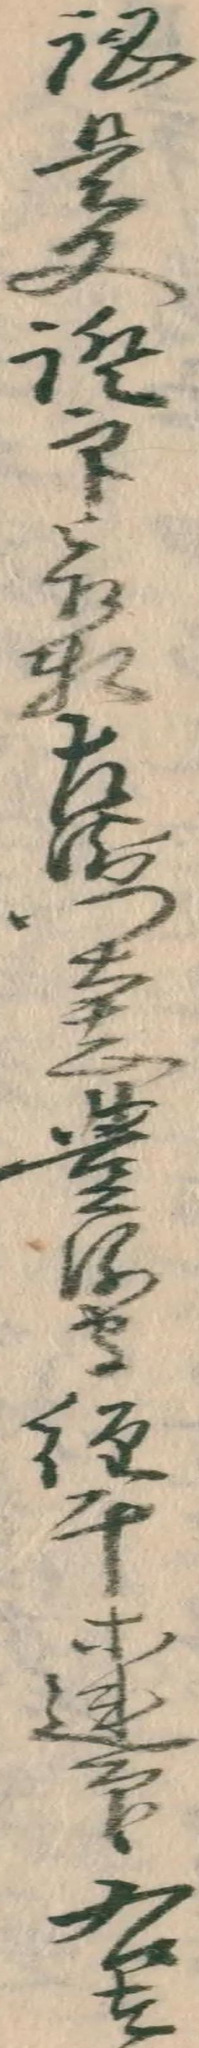認是又證印被相頼左衛門大志豊後守経千等連印右者
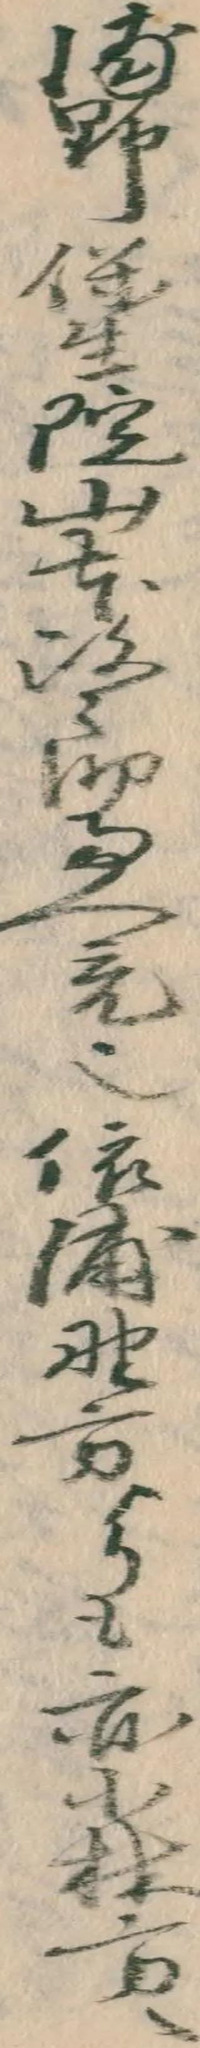浦野保生院山本政之助両人宛也依浦野方よりも亦小林方へ
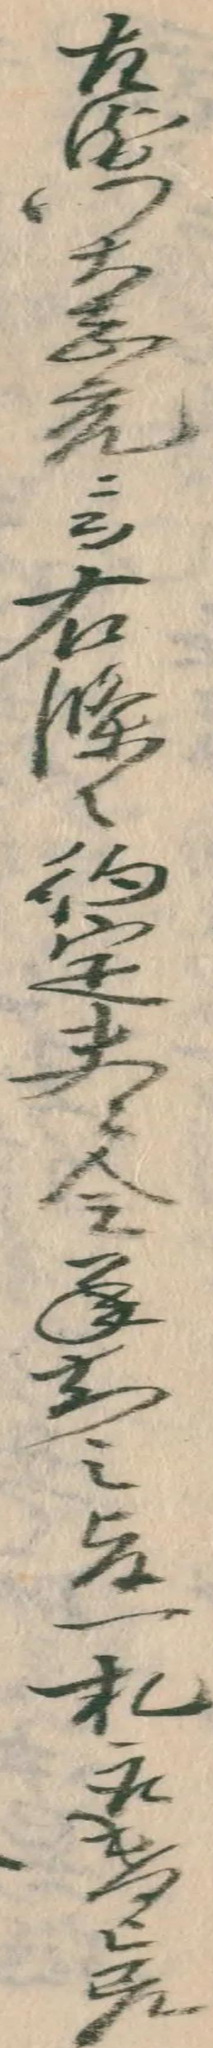左衛門大志充ニ而右條々約定夫々令承知之旨一札取替被差
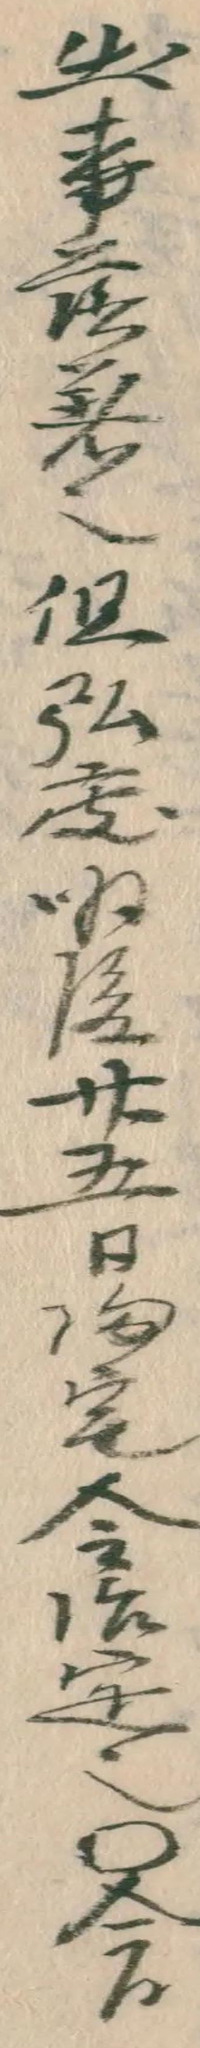出事落着也但弘度明後廿五日帰宅令治定也○今日
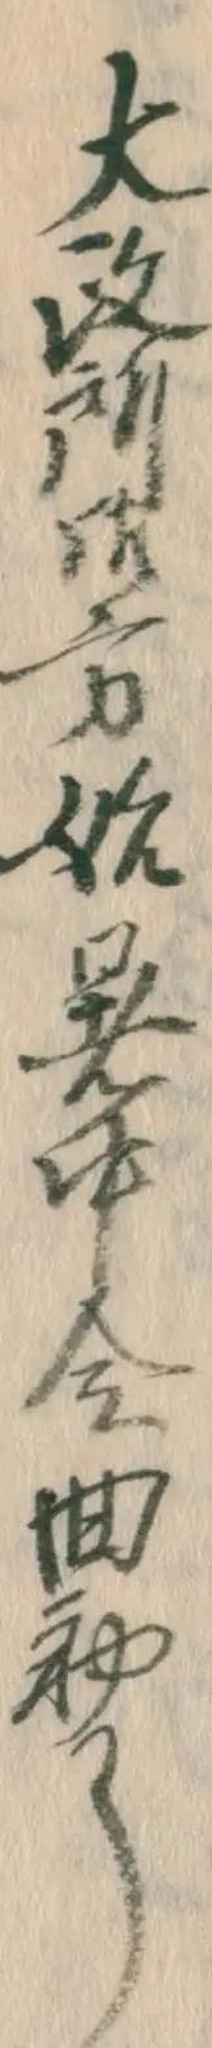大政所御方始暑中令回勤了
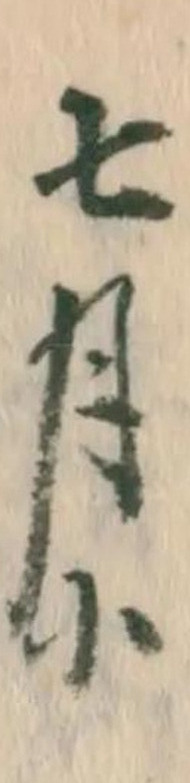七月小
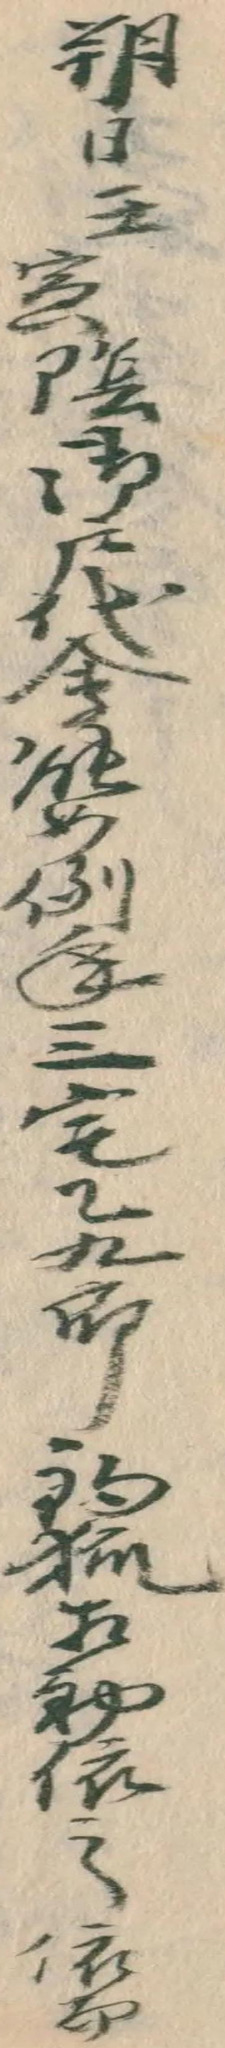朔日壬寅陰御戸代會能如例年三宅乙九郎釣狐相勤依之依而
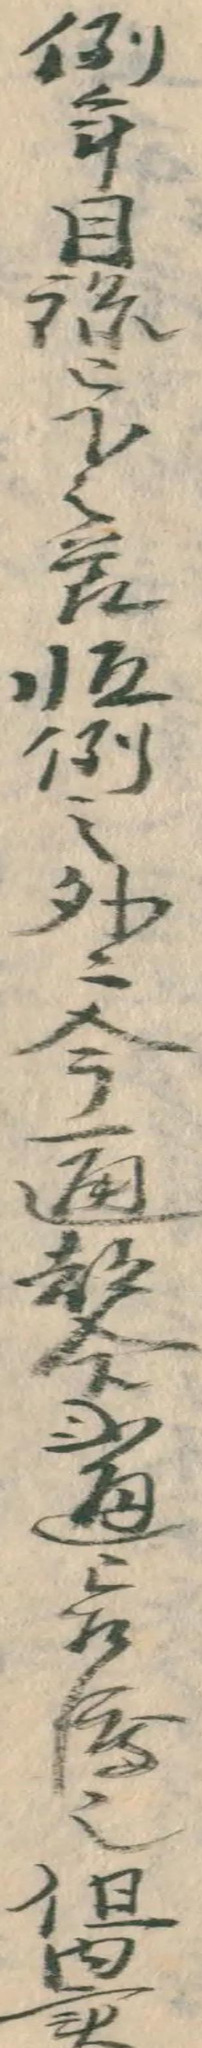例年目録被下之節恒例之外ニ今一通都合弐通被相渡也但内実
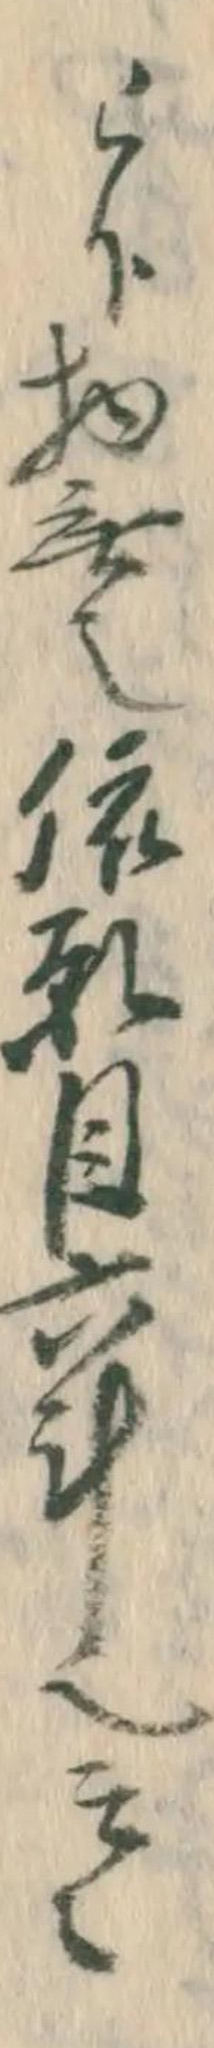被下物無之依願目六斗也云々
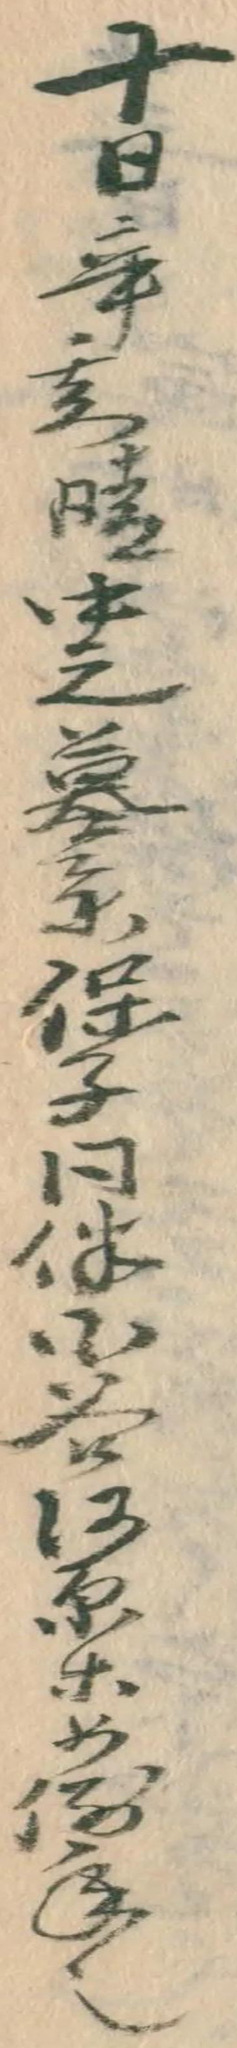十日辛亥晴中元墓参保子同伴小谷河原等如例年也

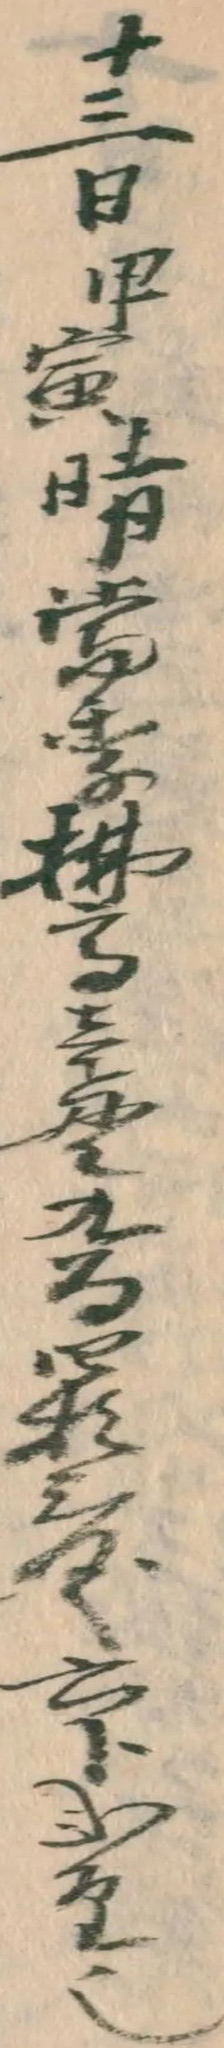十三日甲寅晴當季拂高壱貫九百四拾三匁六分弐厘也
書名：賀茂社記録. 第69冊
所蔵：国立国会図書館 National Diet Library, JAPAN
